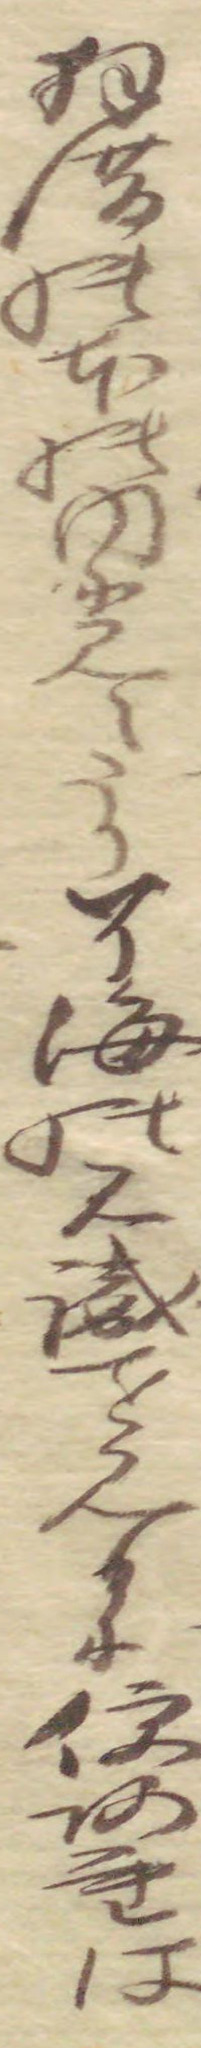拝借の本の内に見えたり了海の見識を見るに便あれは
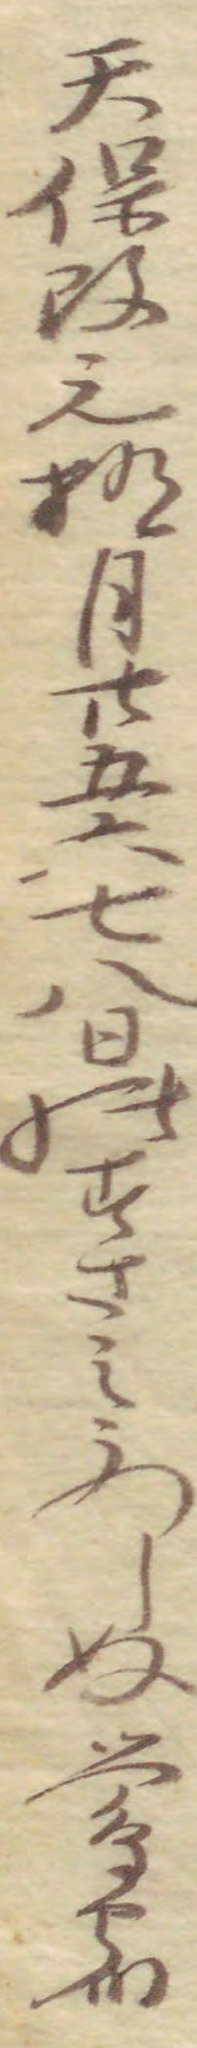天保改元極月廿五六七八日のすさみうつしぬ鶯宿
